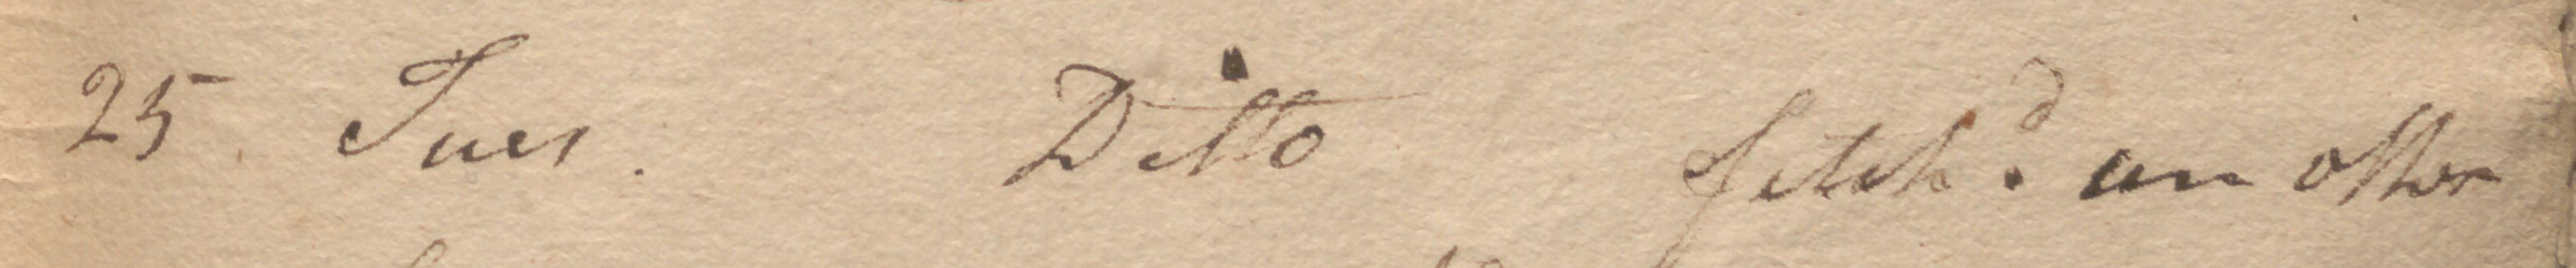25 Tues. Ditto fetch^d. an other
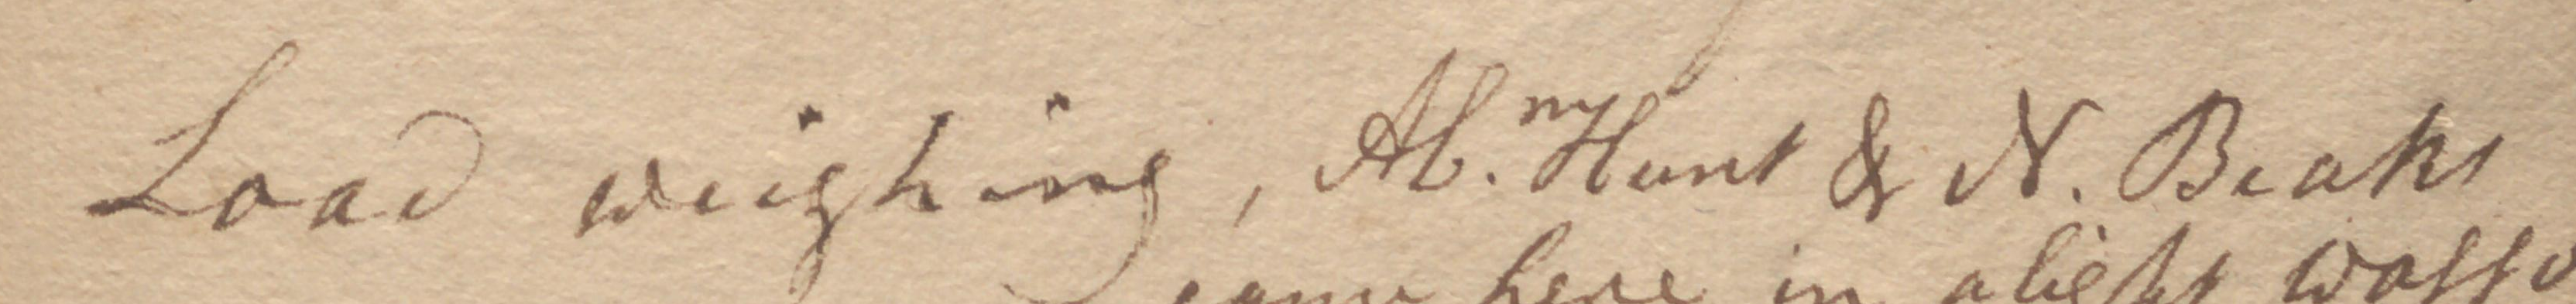Load weighing, Ab^m. Hunt & N. Beaks
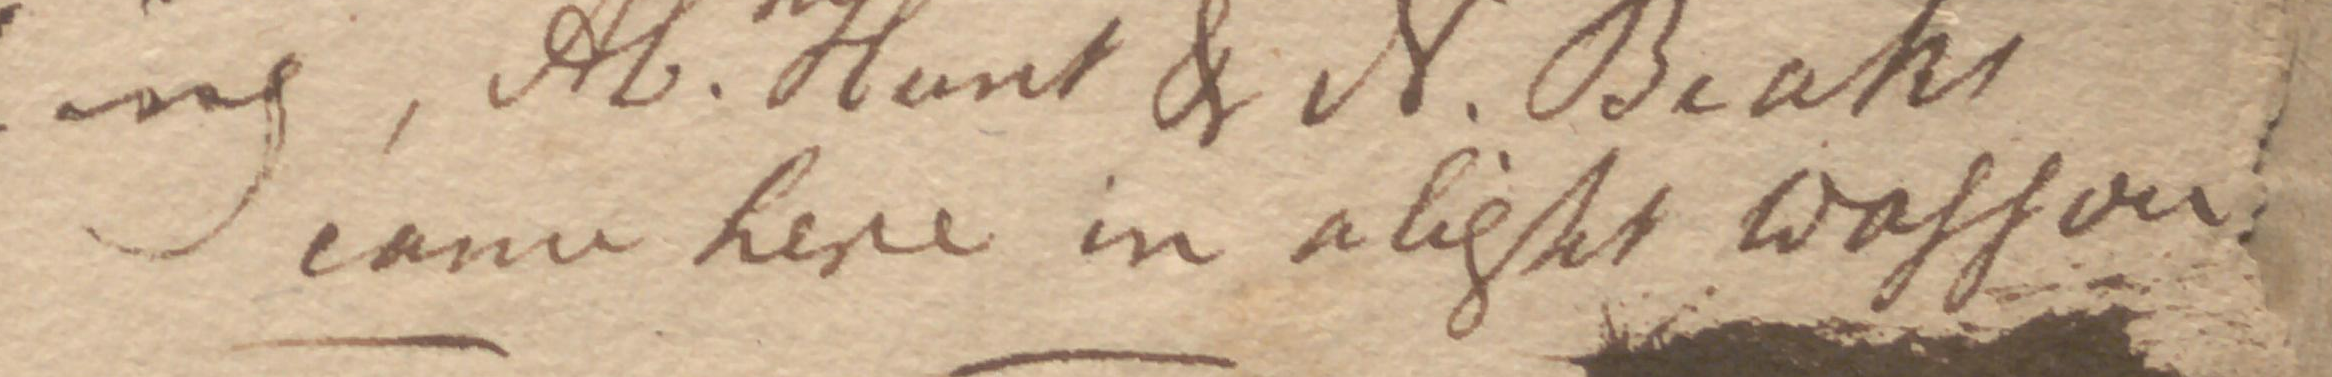Lcame here in a light waggon
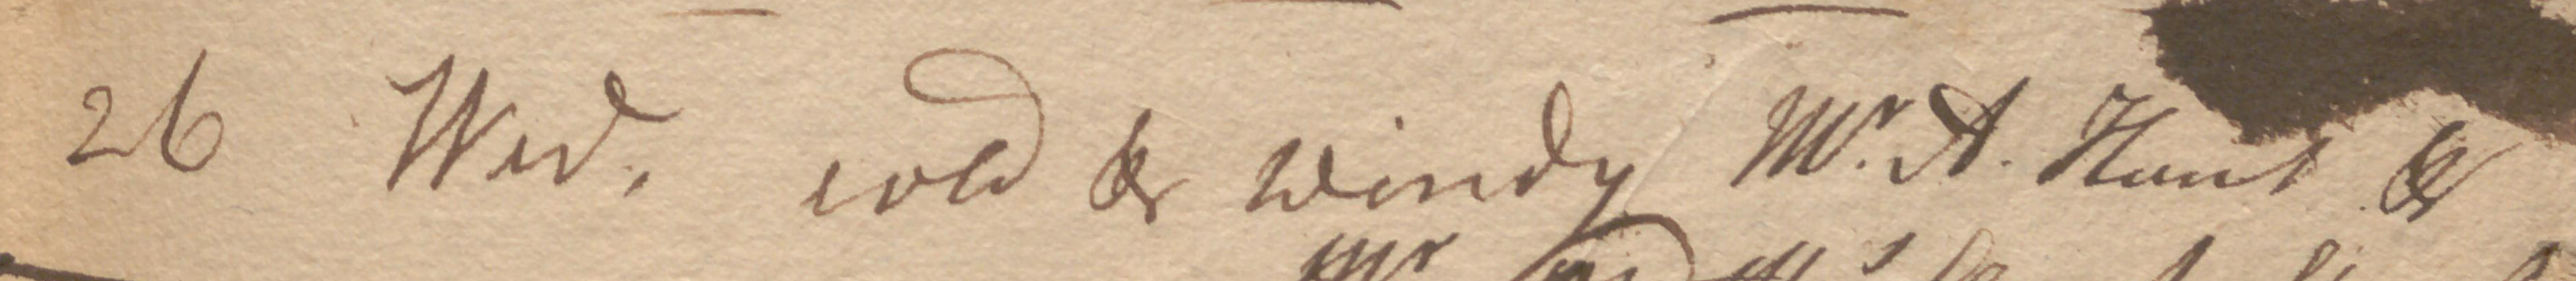26 Wed. cold & windy M^r. A. Hunt &
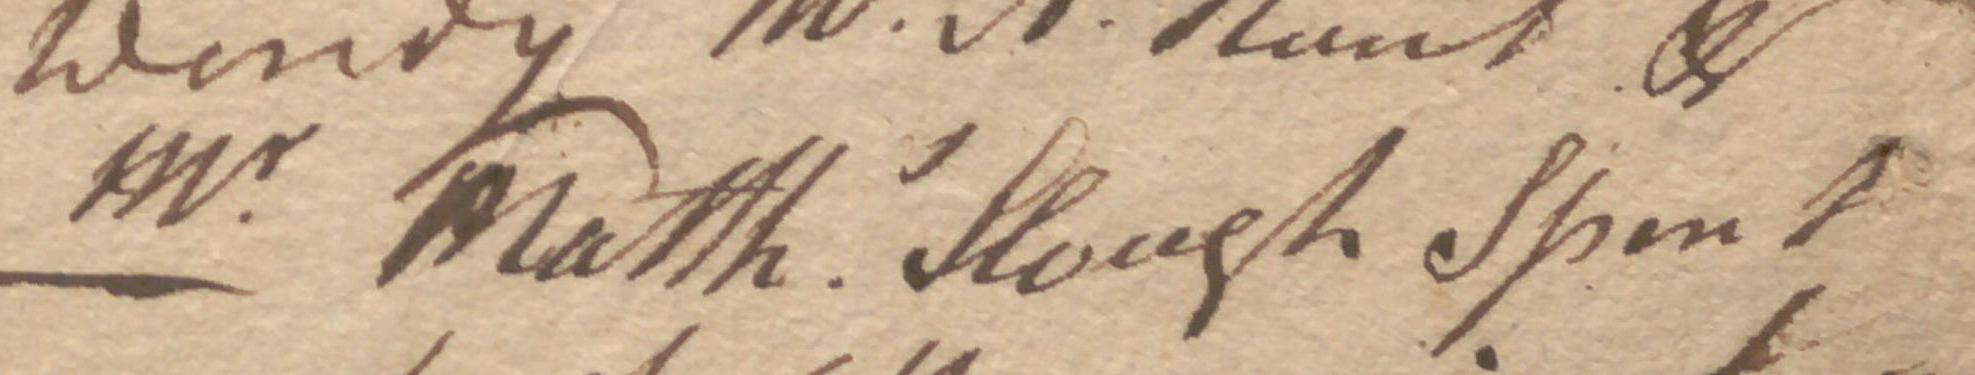M^r. Matth^s. Slough Spent
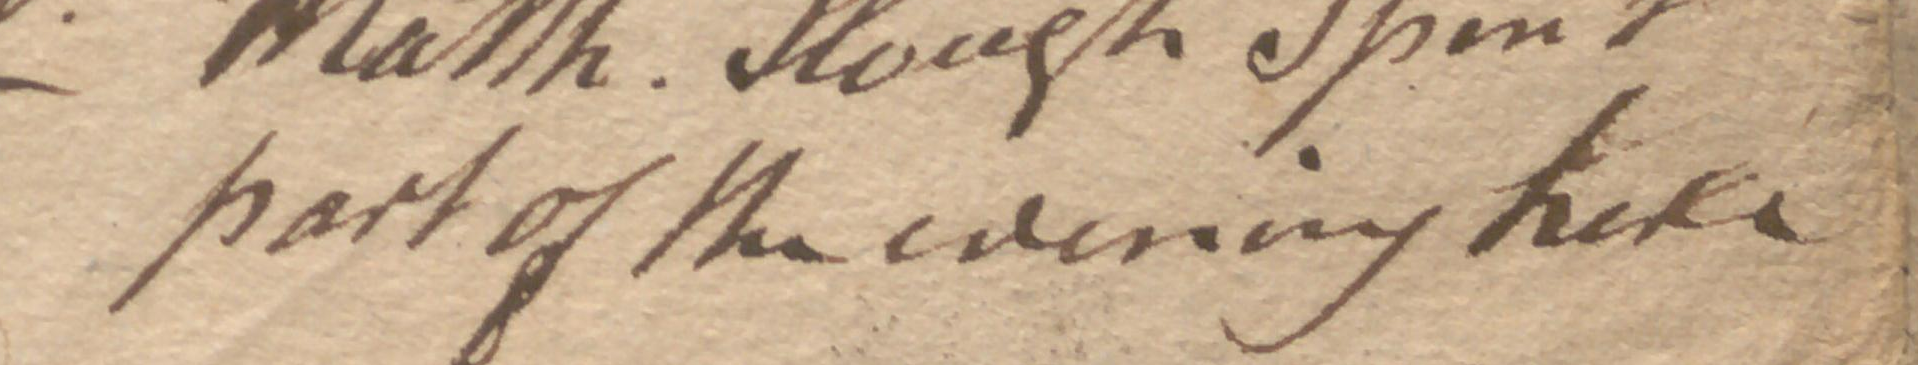part of the evening hire
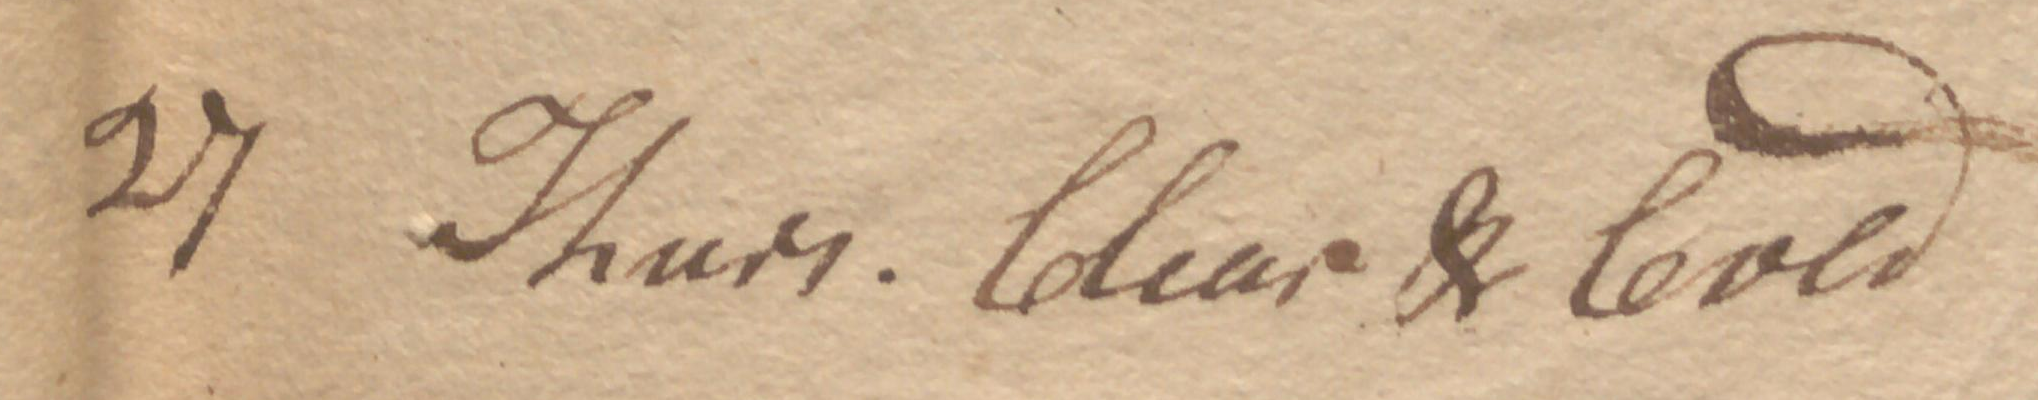27 Thurs. Clear & Cold
